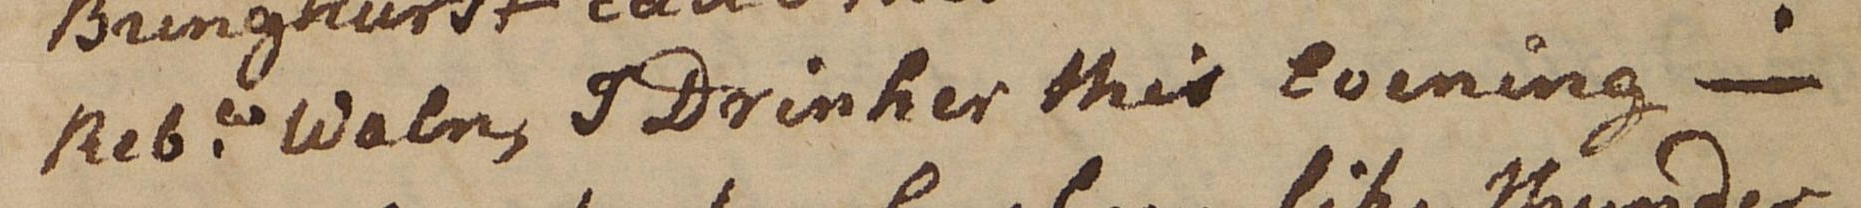Reb^a. Waln, J Drinker this Evening-
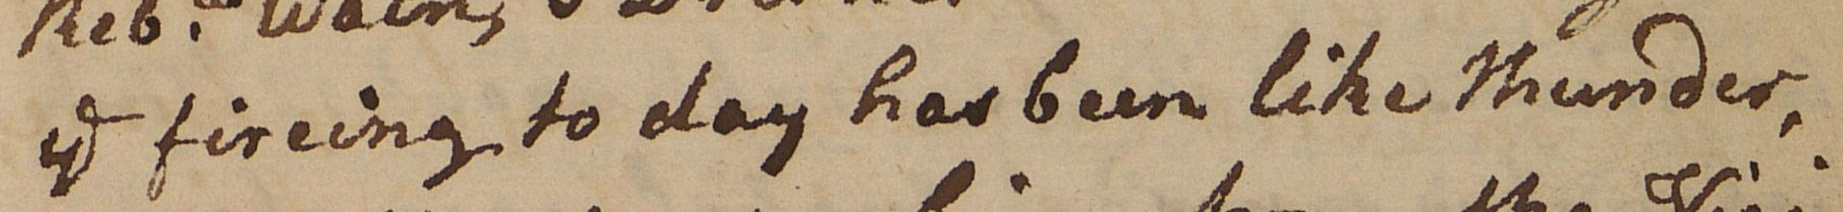y^e fireing to day has been like thunder,
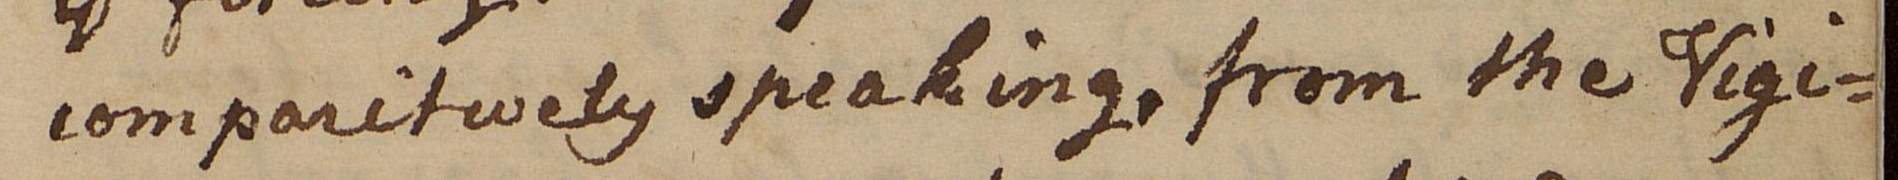comparitevely speaking, from the Vigi-
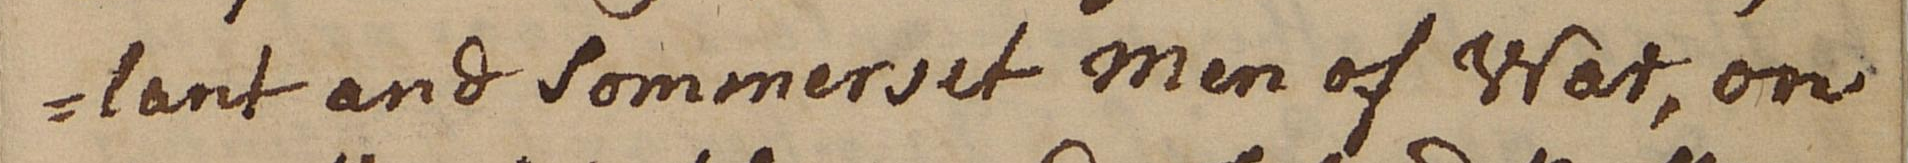-lant and Sommerset men of War, on
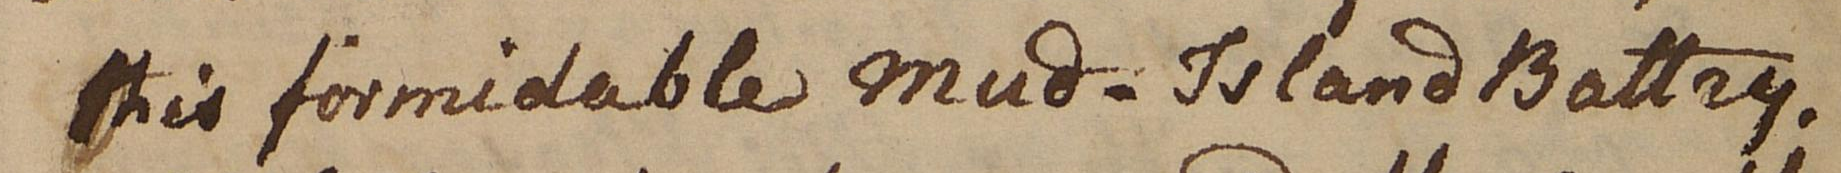this formidable Mud-Island Battry.
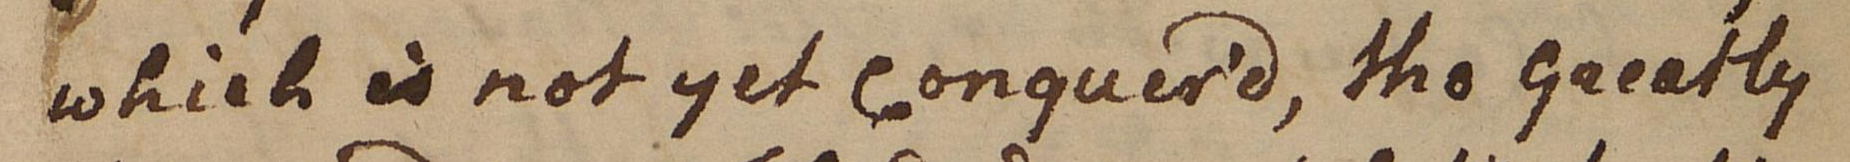which is not yet conquer'd, the Greatly
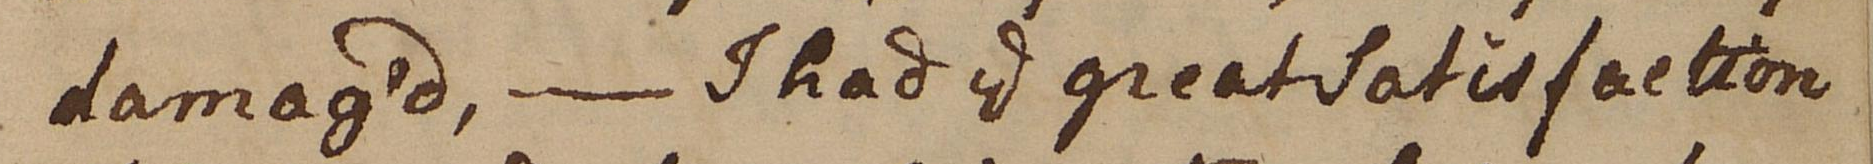damag'd,- I had y^e great Satisfaction
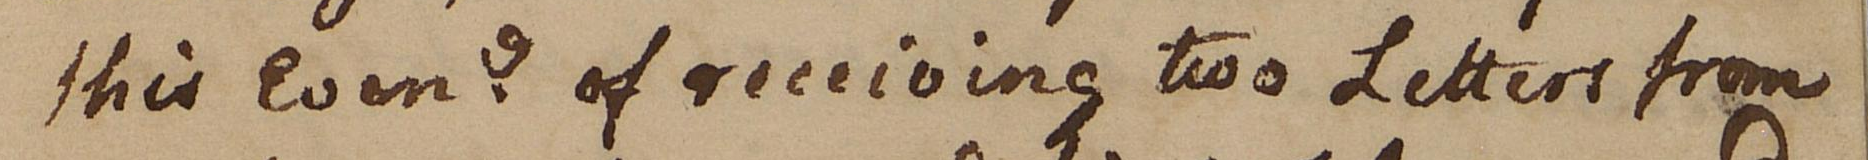this Even^g. of receiving two Letters from
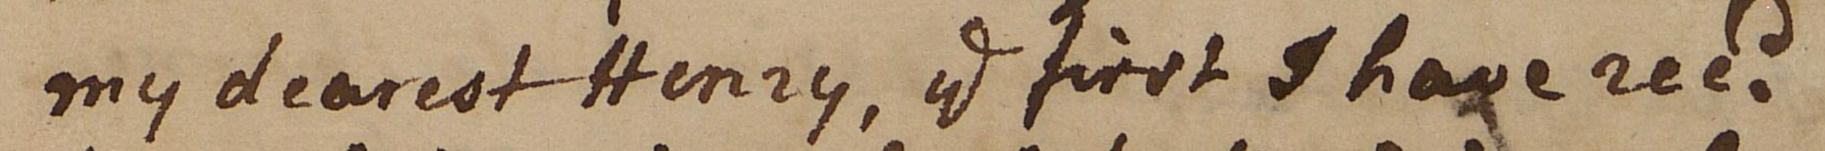my dearest Henry, y^e First I have rec^d.
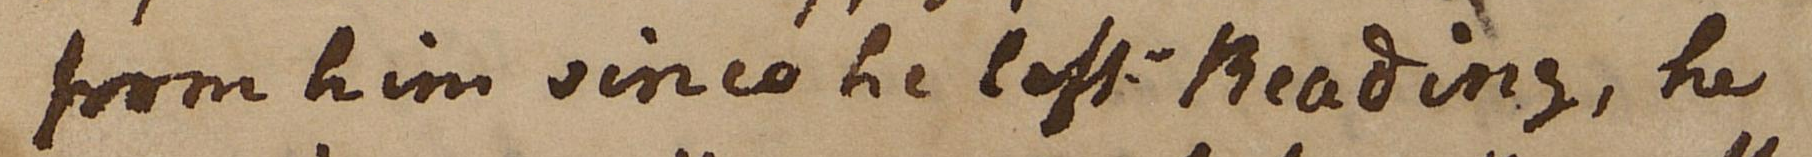from him since he left Reading, he
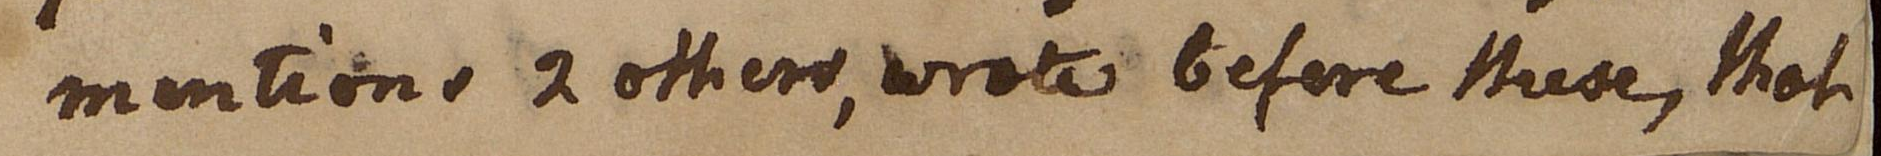mentions 2 others, wrote before then, that
